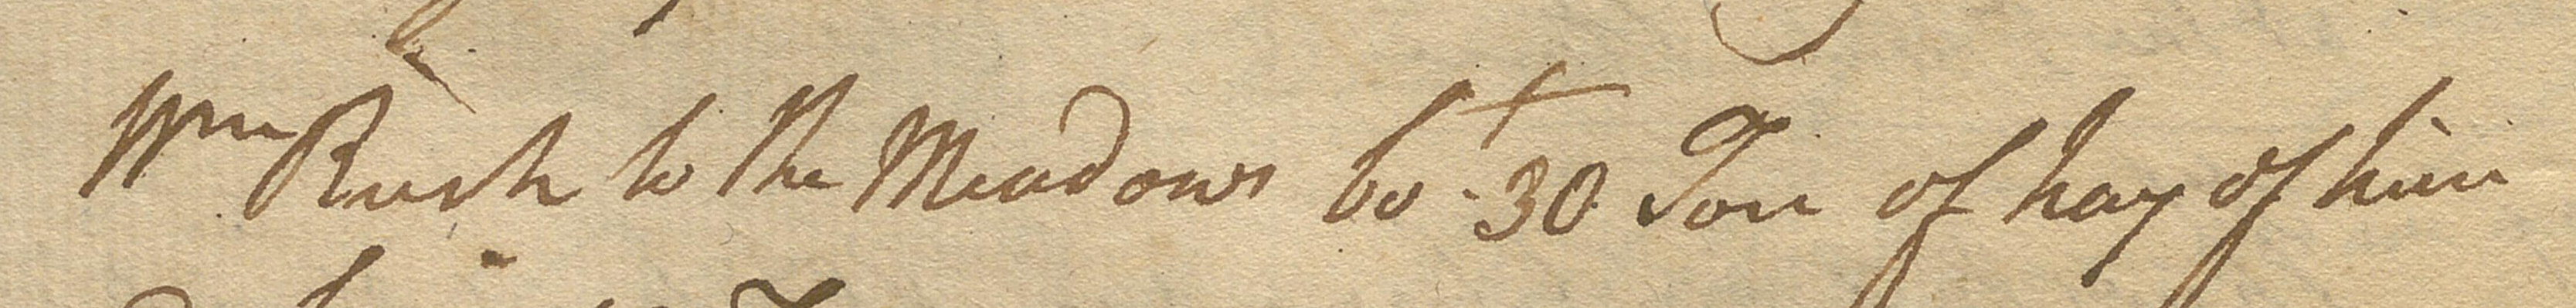W^m. Rush to the Meadows bo^t. 30 Ton of hay of him
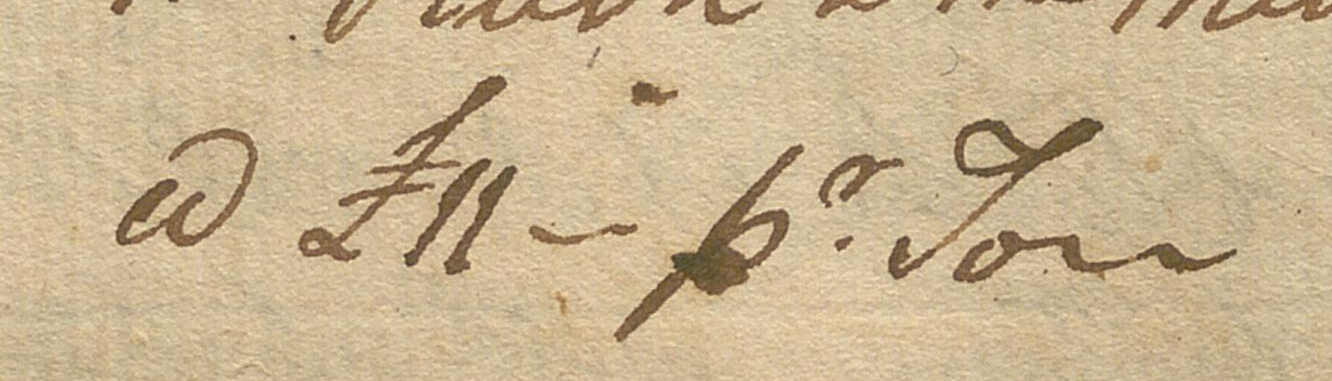@ £11- p^r. Ton
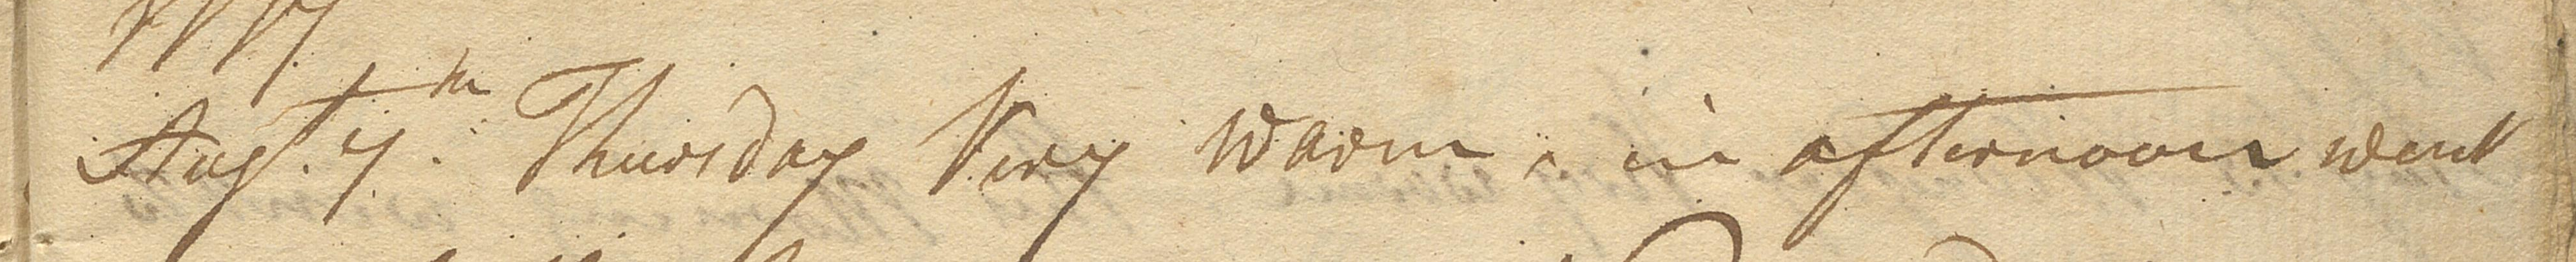Aug^t. 7^th. Thursday Very Warm in afternoon went
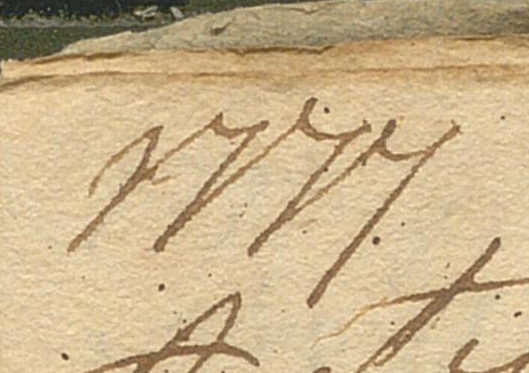1777
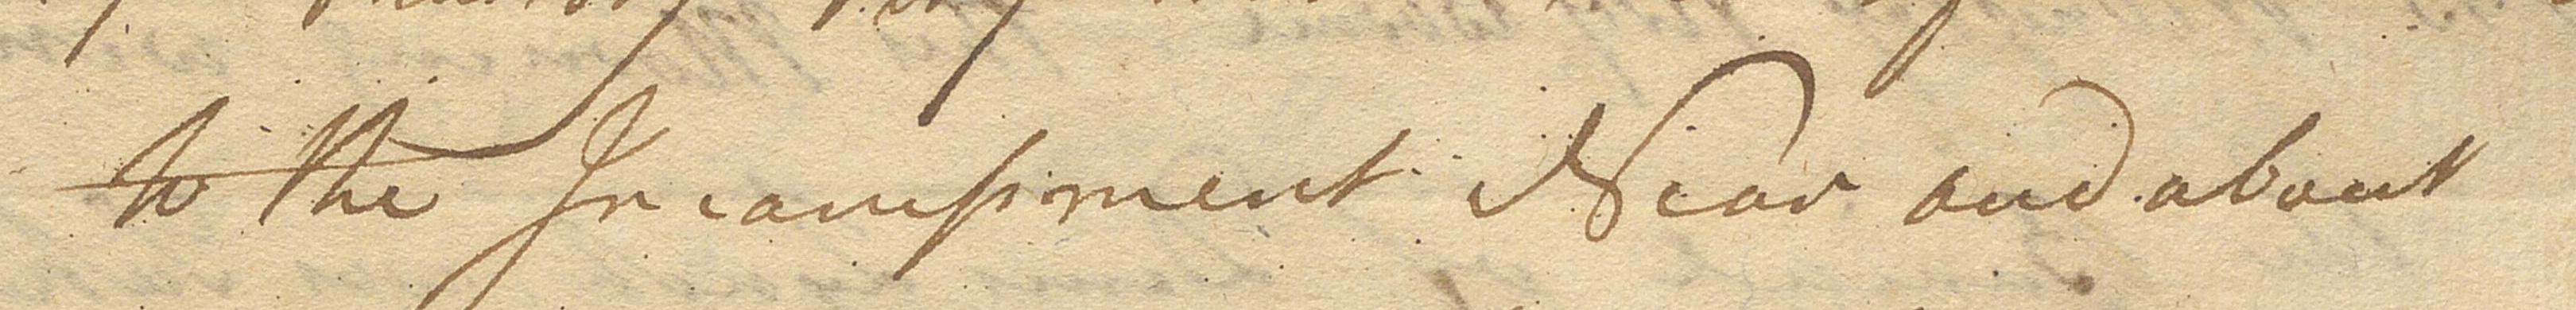to the Incampment Near and about
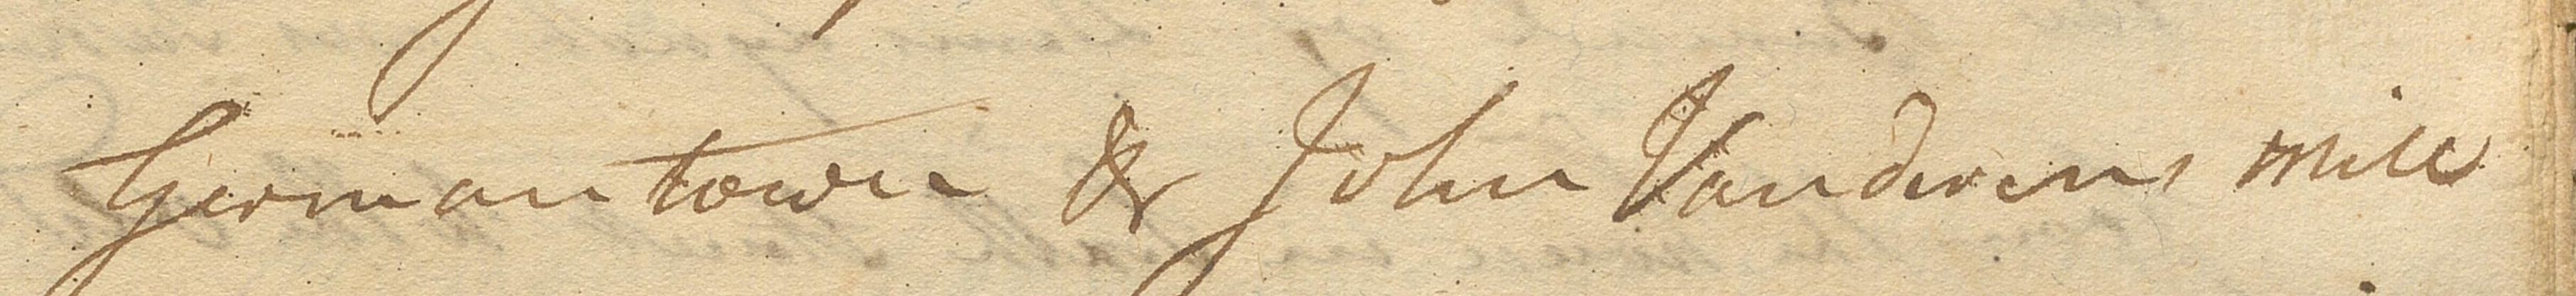Germantown & John Vanderens mile
